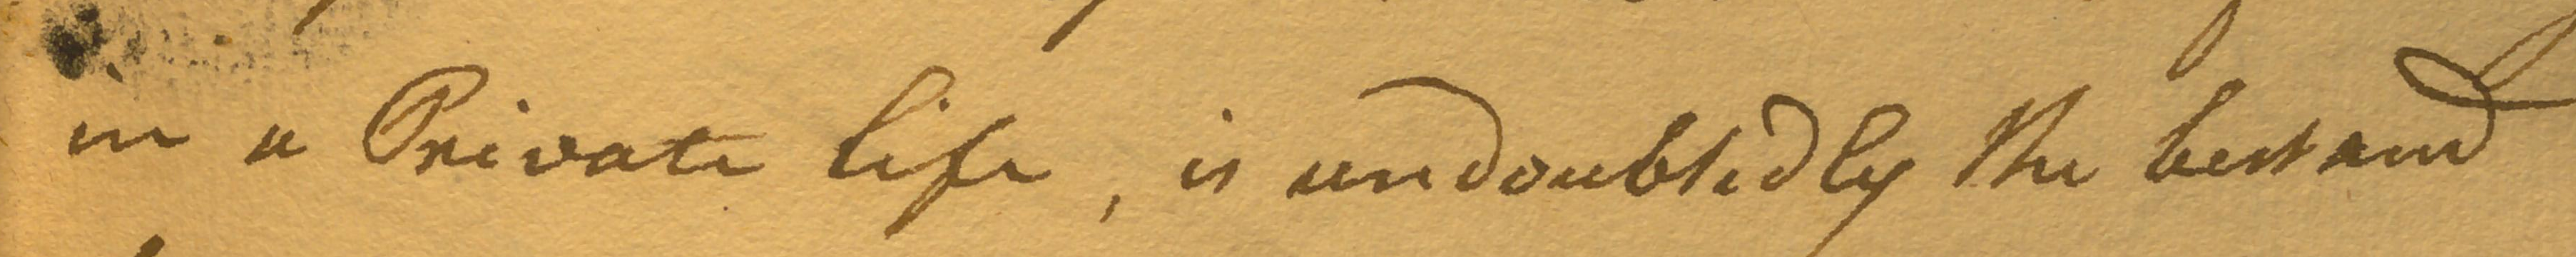in a Private life is undoubtidly the best and
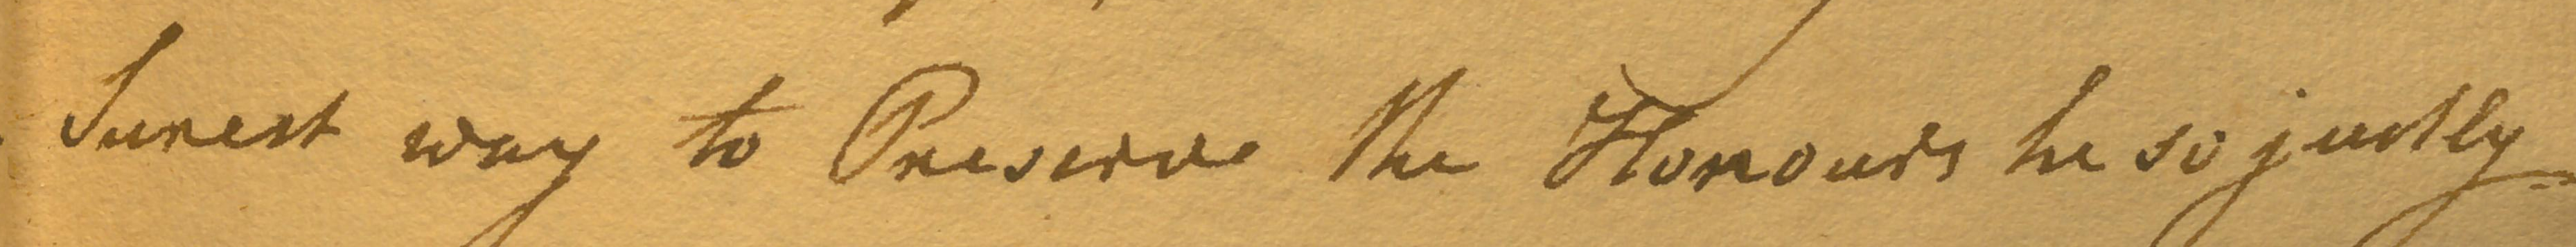Surest way to Preserve the Honours he so justly
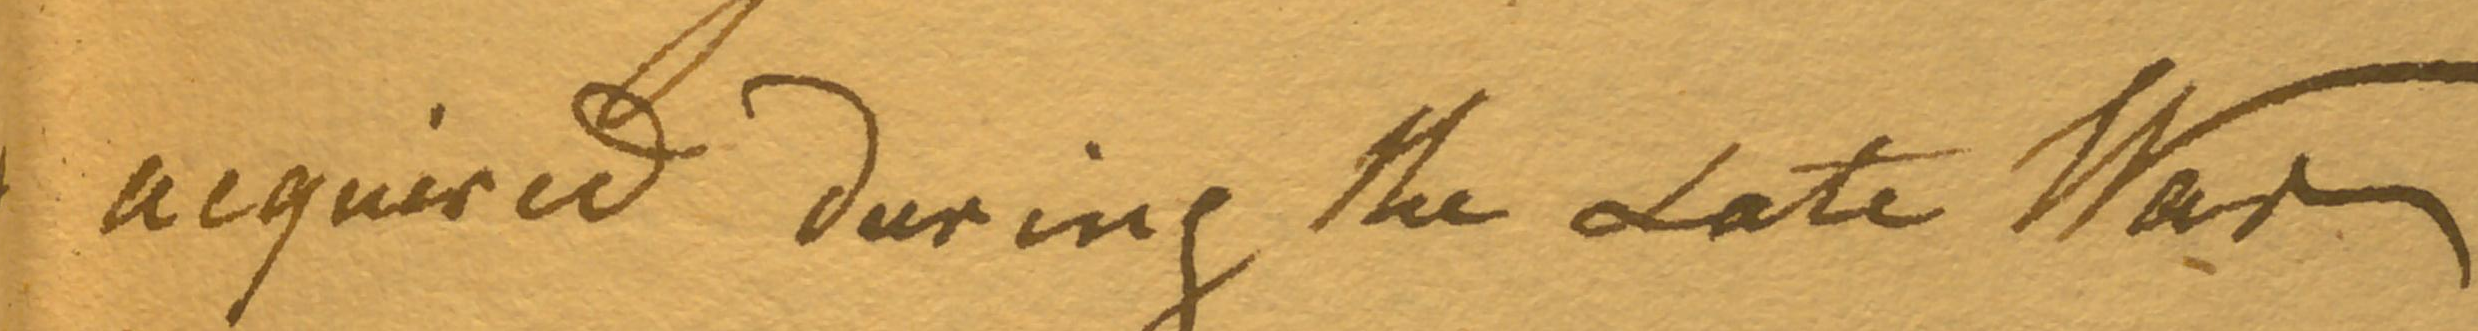acquired during the Late War
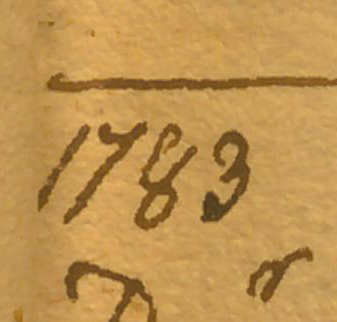1783
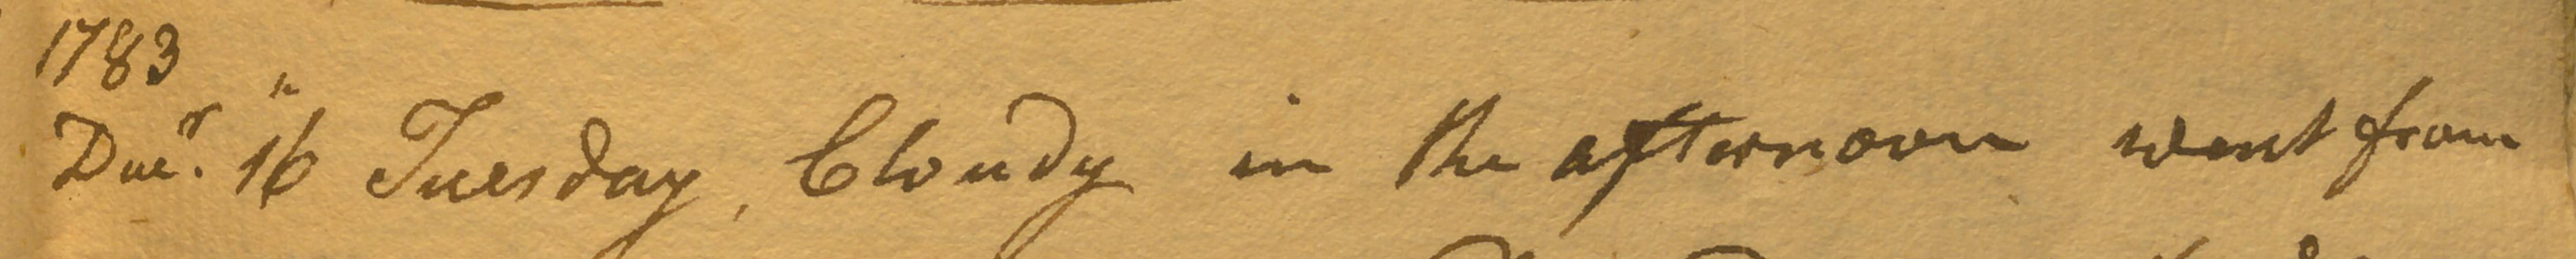Dec^r. 16 Tuesday Cloudy in the afternoon went from
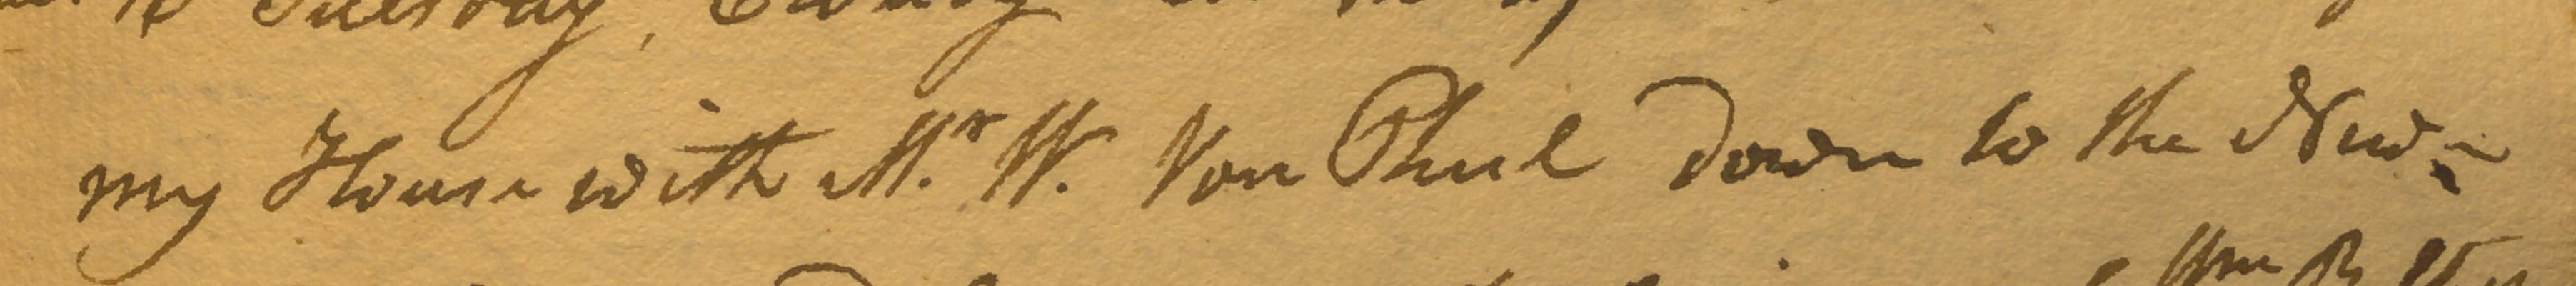my House with M^r. W. Von Phul down to the New-
